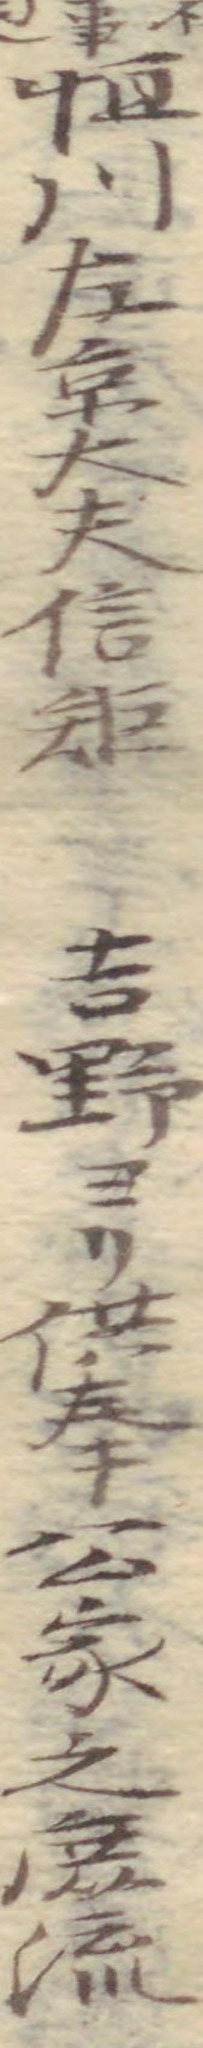恒川左京大夫信矩吉野ヨリ供奉公家之庶流
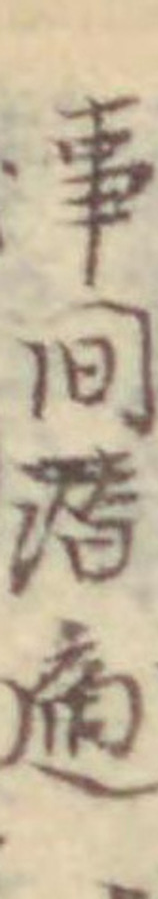事間潜適
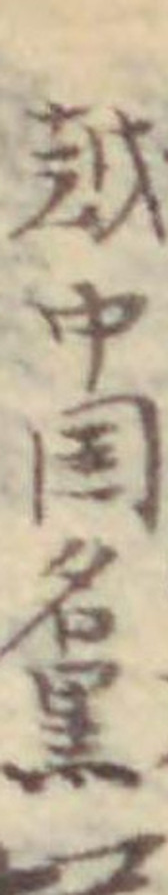越中国名黒
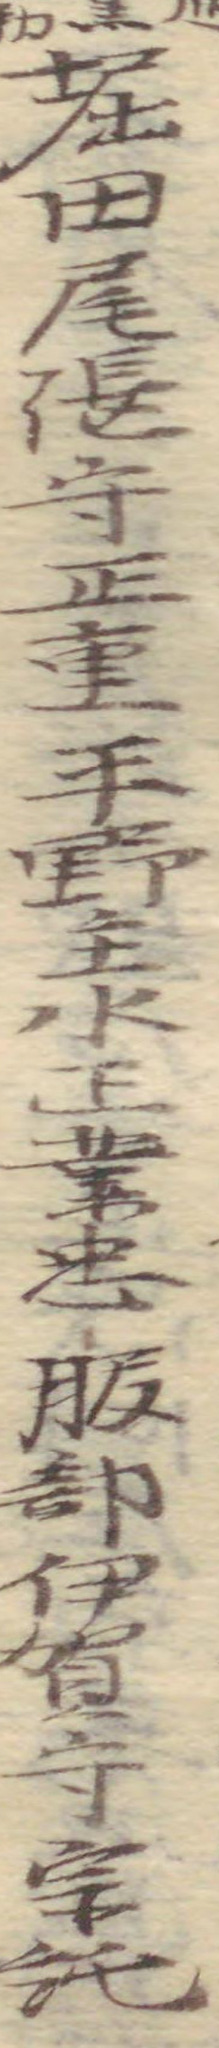堀田尾張守正重平野主水正業忠服部伊賀守宗純
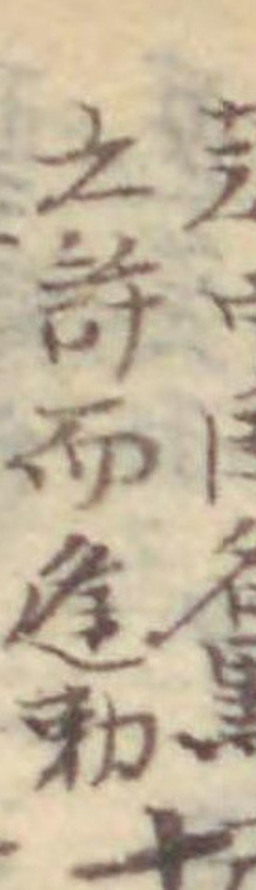之許而逢勅
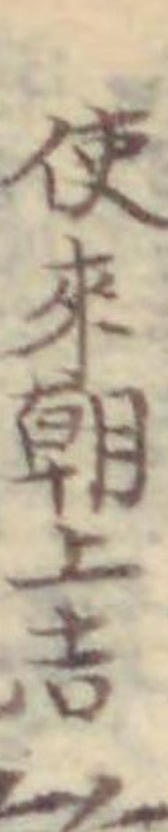使来朝上吉
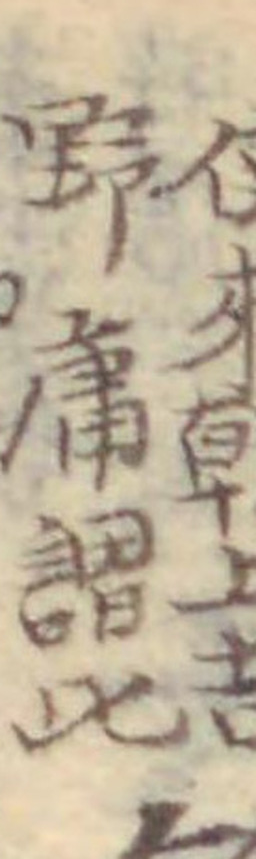野庸謂此
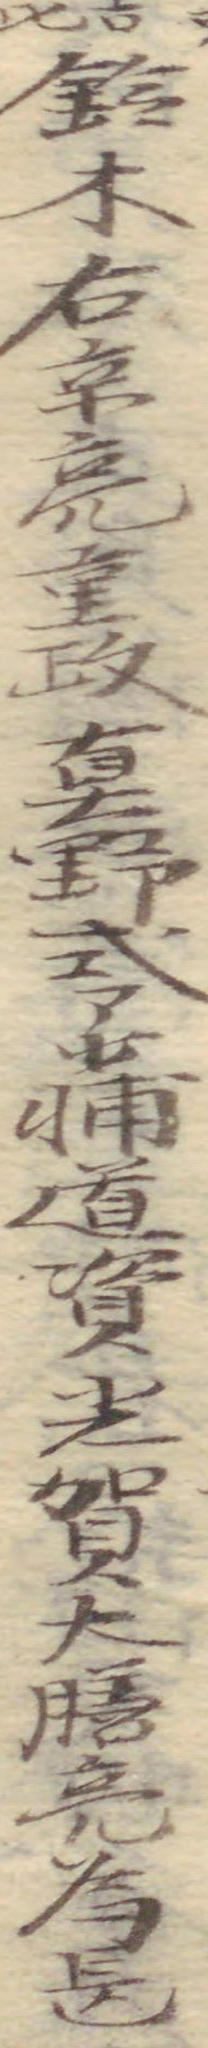鈴木右京亮重政真野式部少輔道資光賀大膳亮為長
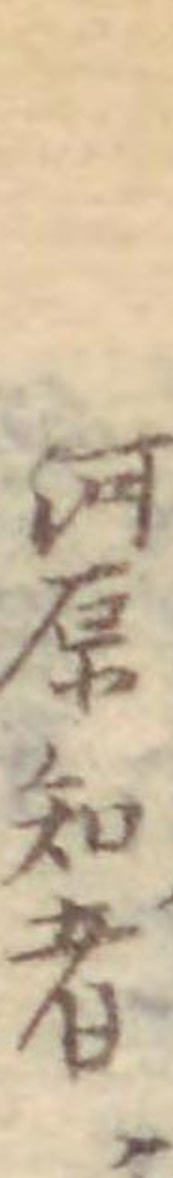河原知者
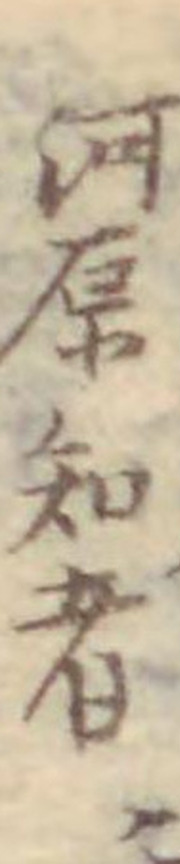河原知者
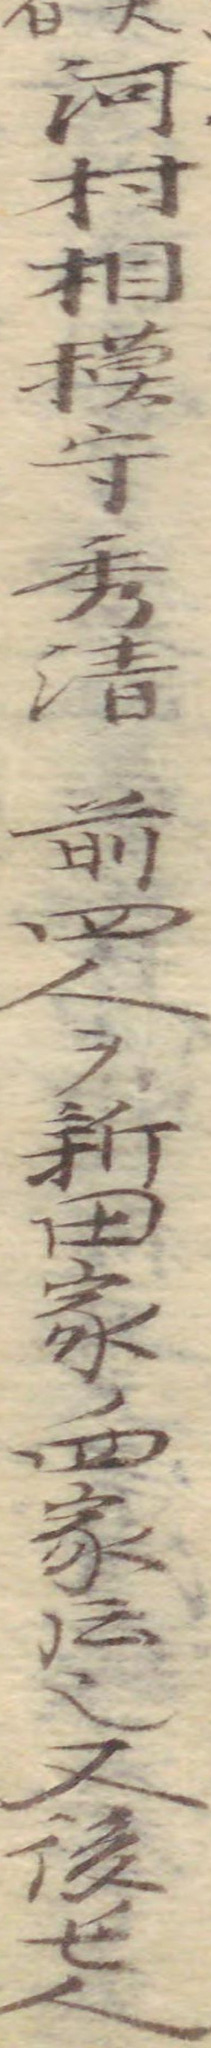河村相模守秀清前四人ヲ新田家ノ四家伝也又後ノ七人
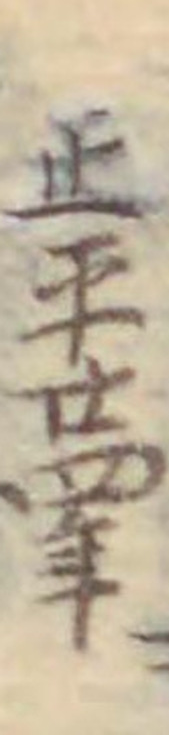正平廿四年
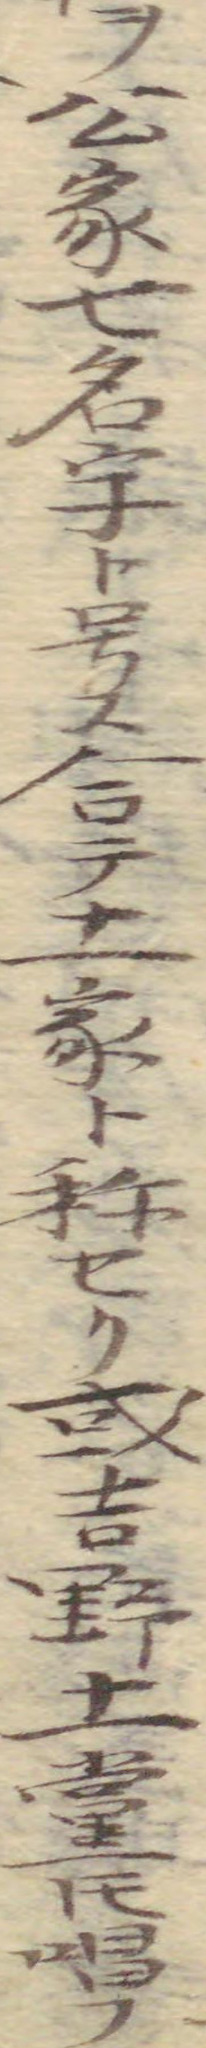ヲ公家七名字ト号ス合テ十一家ト称セリ或吉野十一尚黒トモ唱フ
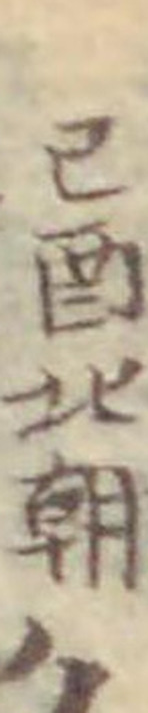己酉北朝
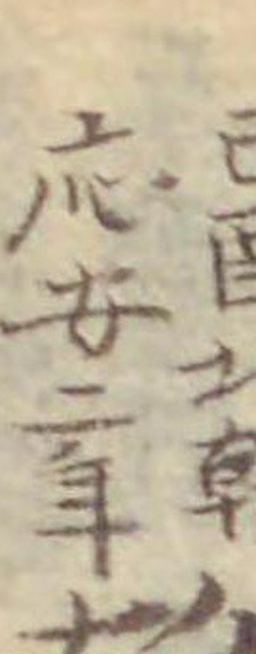応安二年
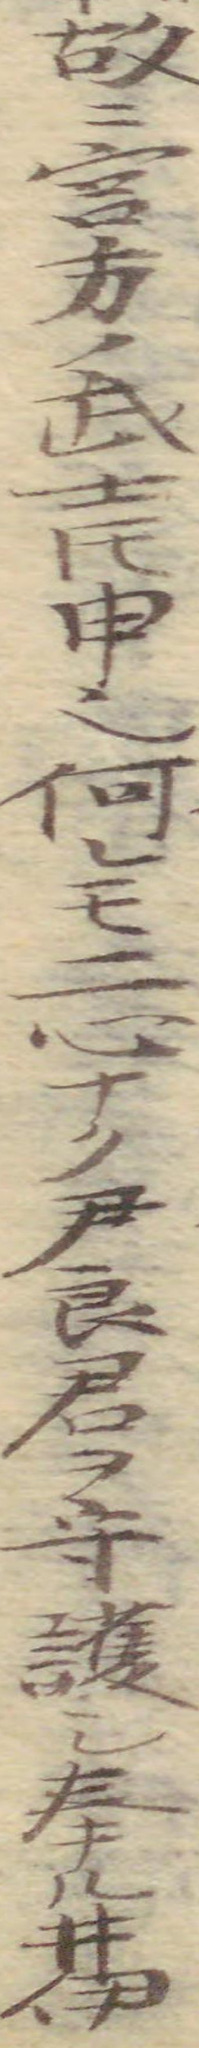故ニ宮方ノ武士トモ申也何レモ二心ナク尹良君ヲ守護シ奉ル井伊
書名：鶯宿雑記. 巻199-200
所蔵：国立国会図書館 National Diet Library, JAPAN
